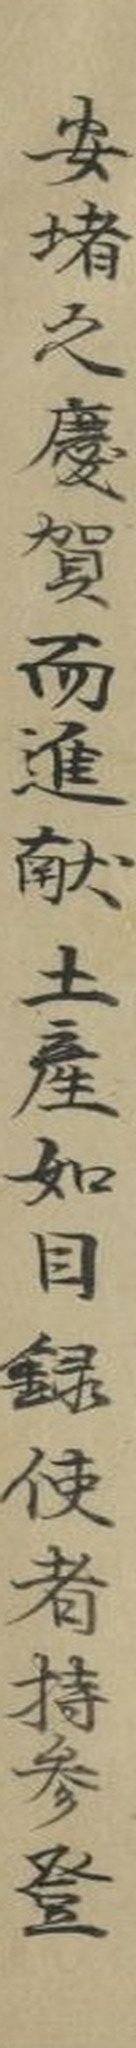安堵之慶賀而進献土産如目録使者持参登

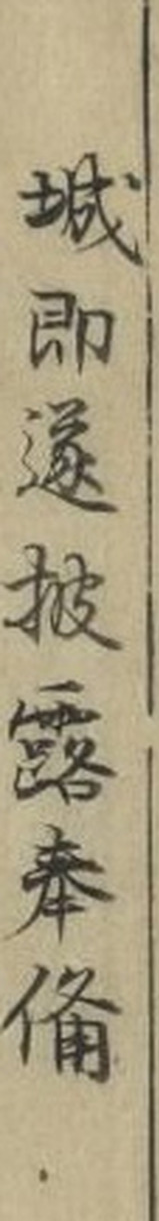城即遂披露奉備
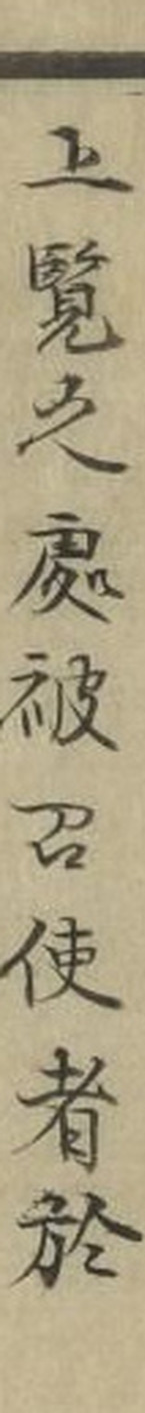上覧之處被召使者於
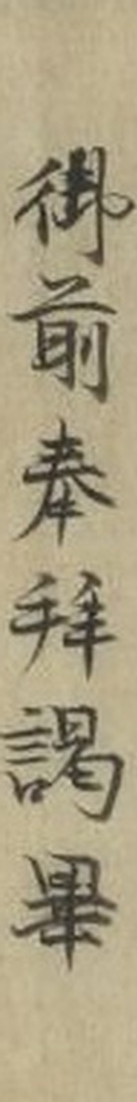御前奉拝謁畢
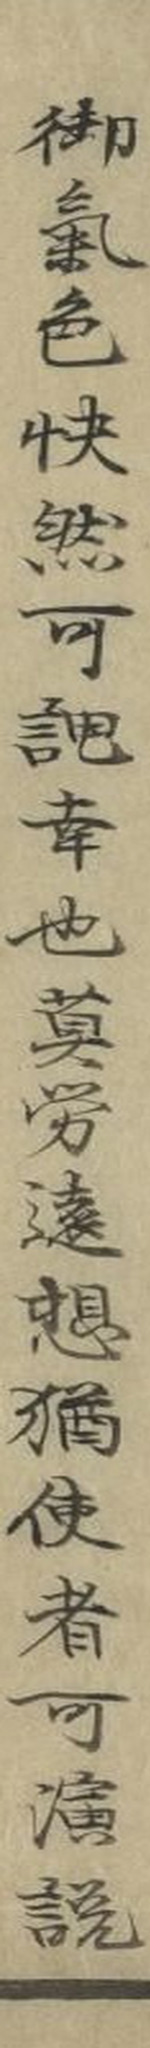御気色快然可託幸也莫労遠想猶使者可演説
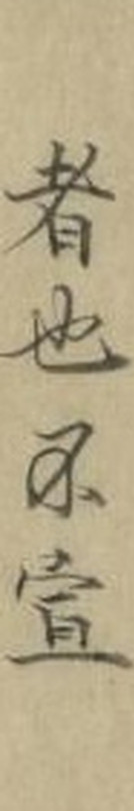者也不宣
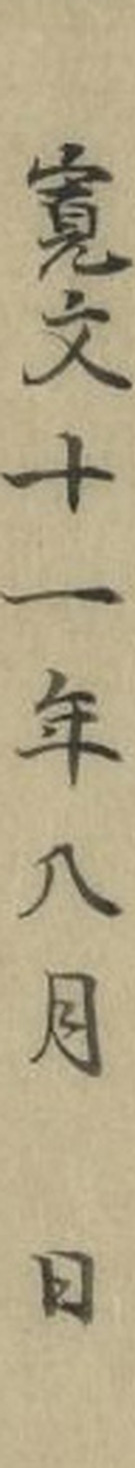寛文十一年八月日
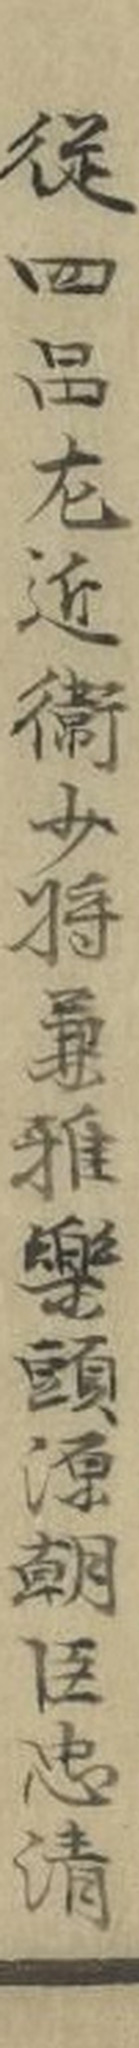従四品左近衛少将兼雅楽頭源朝臣忠清
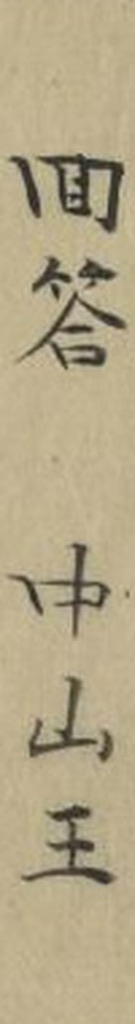回答中山王
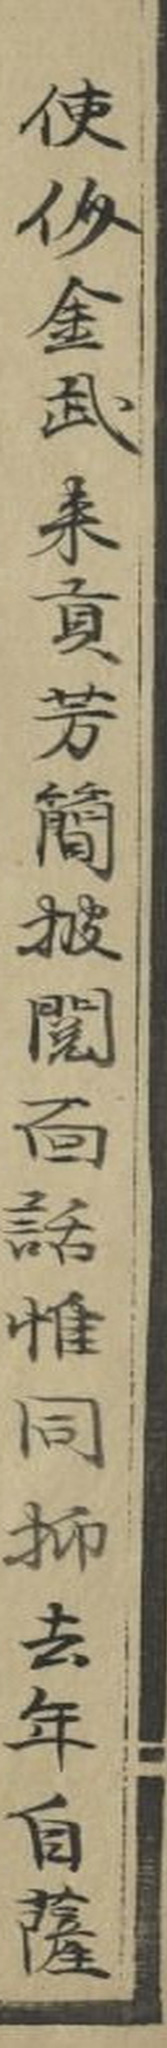使价金武来貢芳簡被閲面話惟同抑去年自薩
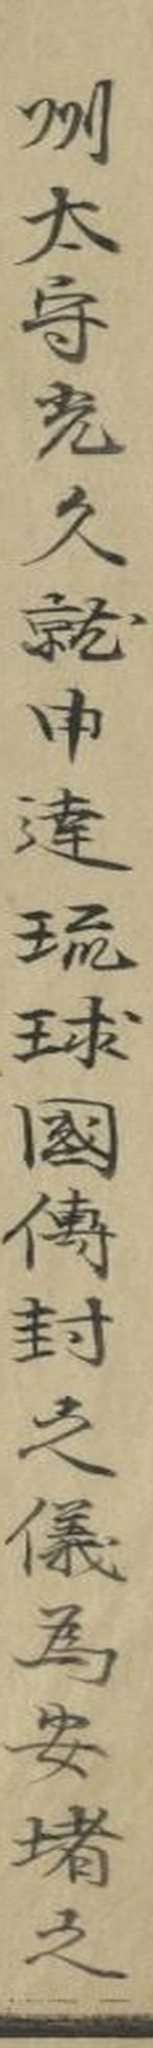州太守光久就申達琉球国伝封之儀為安堵之
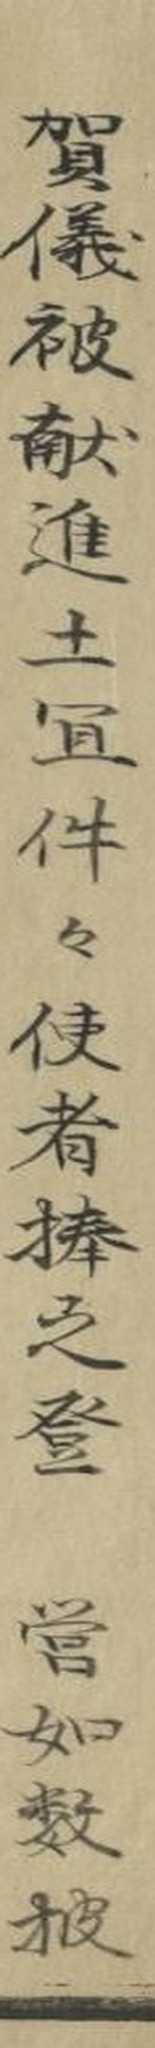賀儀被献進土冝件々使者捧之登営如数披
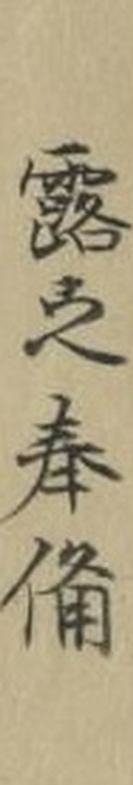露之奉備
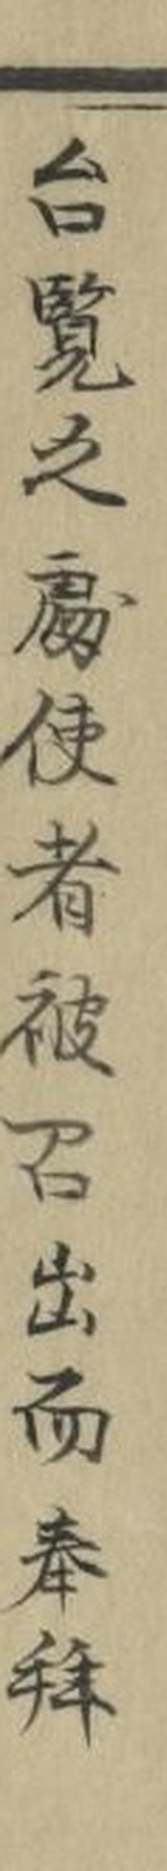台覧之處使者被召出而奉拝
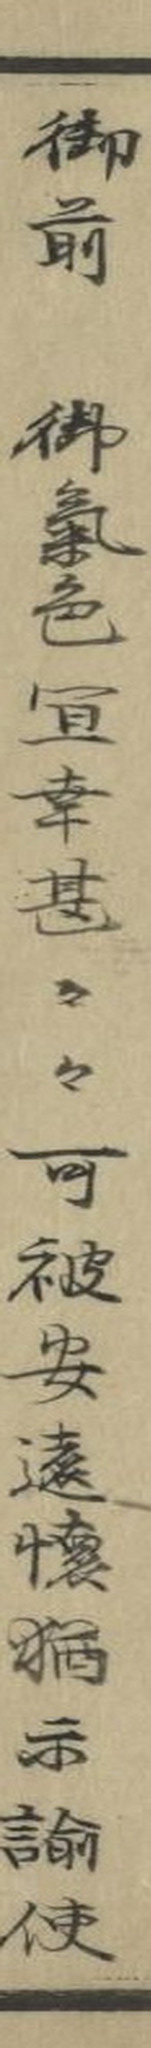御前御気色宜幸甚々々可被安遠懐猶示諭使
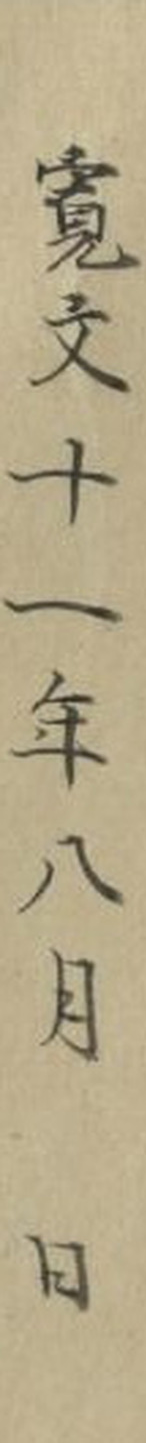寛文十一年八月日
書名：琉球往来（下）
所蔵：University of the Ryukyus Library
